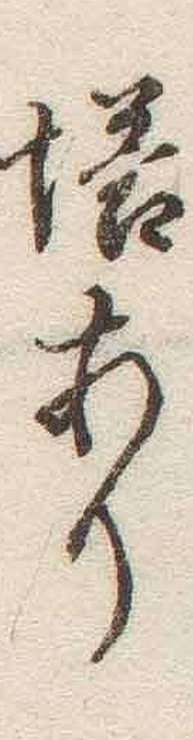塔あり
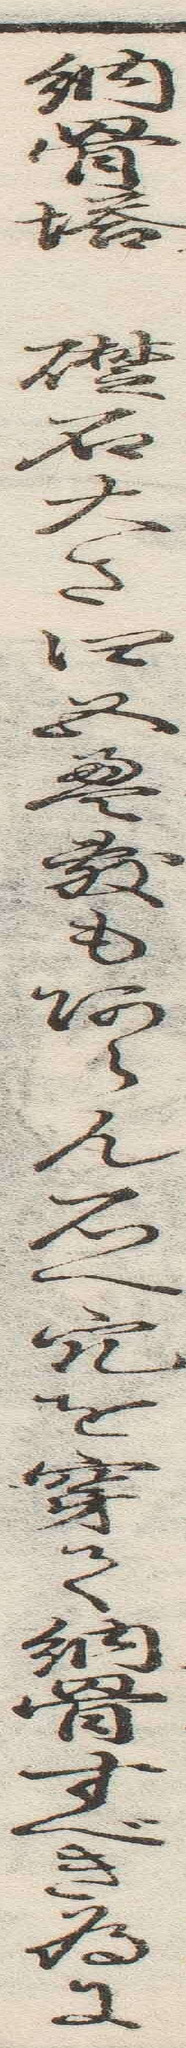納骨塔礎石大さ四五疊敷もあらん石へ穴を穿て納骨すべき為に
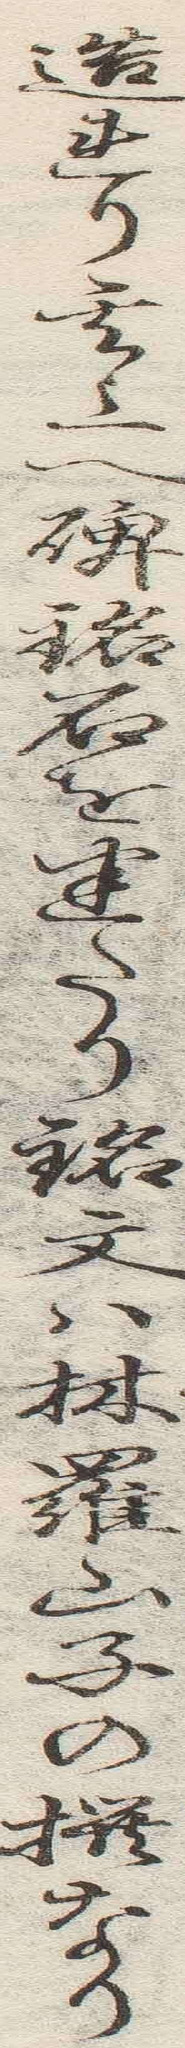造れり其上へ碑銘石を建たり銘文は林羅山子の撰なり
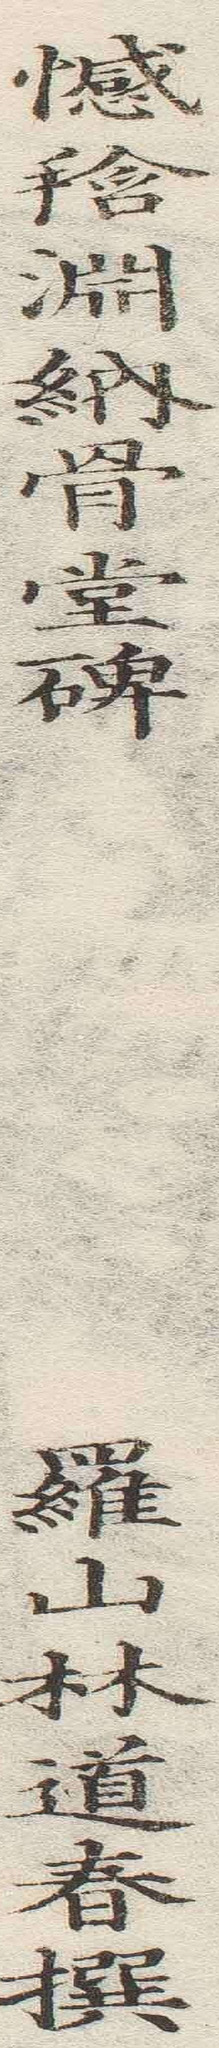憾𤚥淵納骨堂碑羅山林道春撰
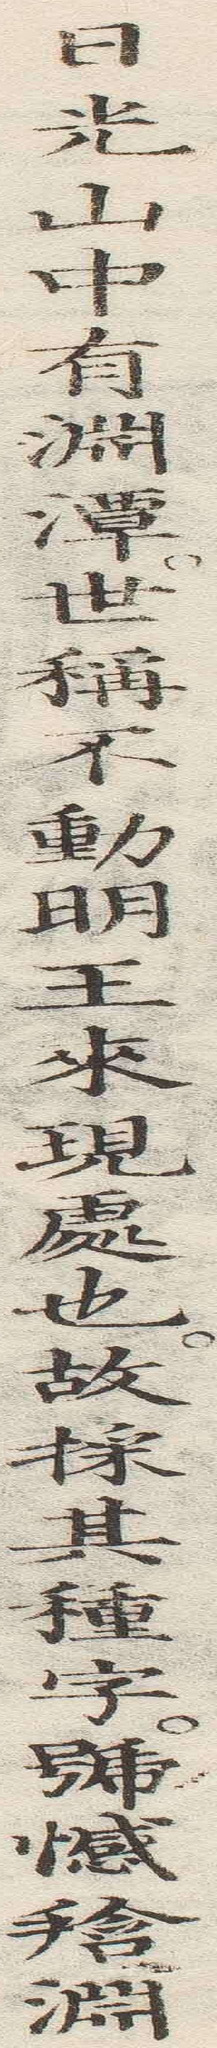日光山中有淵潭。世稱不動明王來現處也。故採其種字。號憾𤚥淵
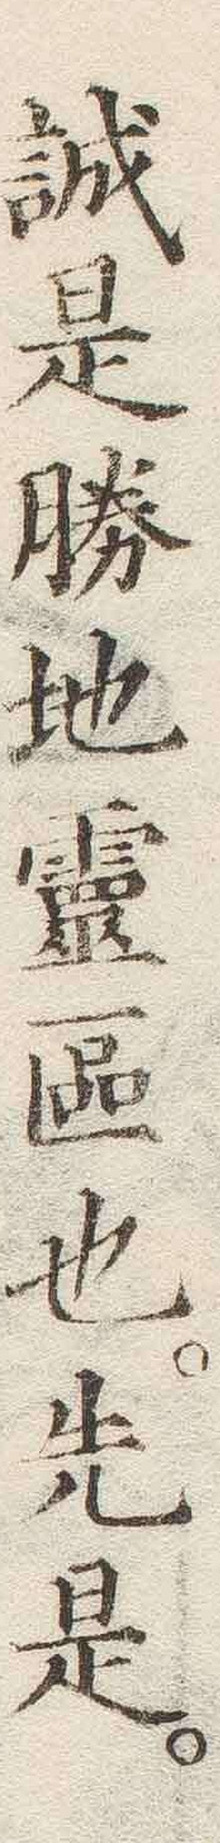誠是勝地靈區也。先是。
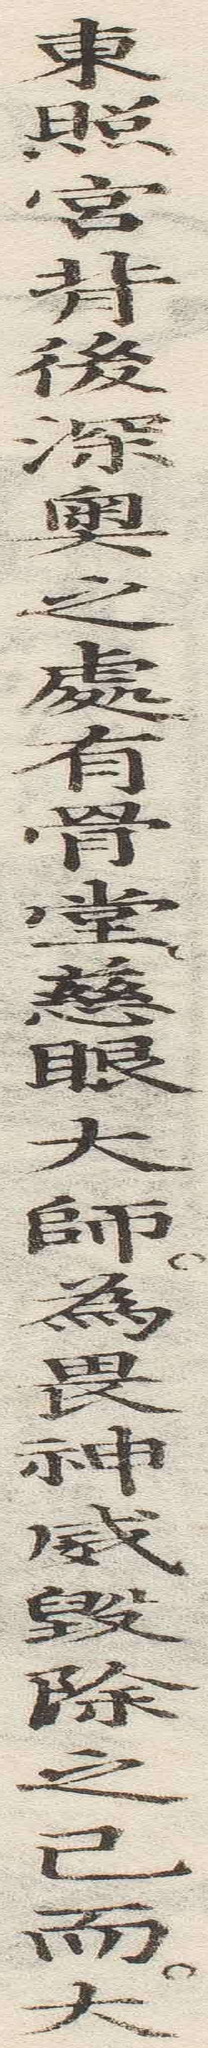東照宮背後深奥之處有骨堂。慈眼大師。為畏神威毀除之已而。大
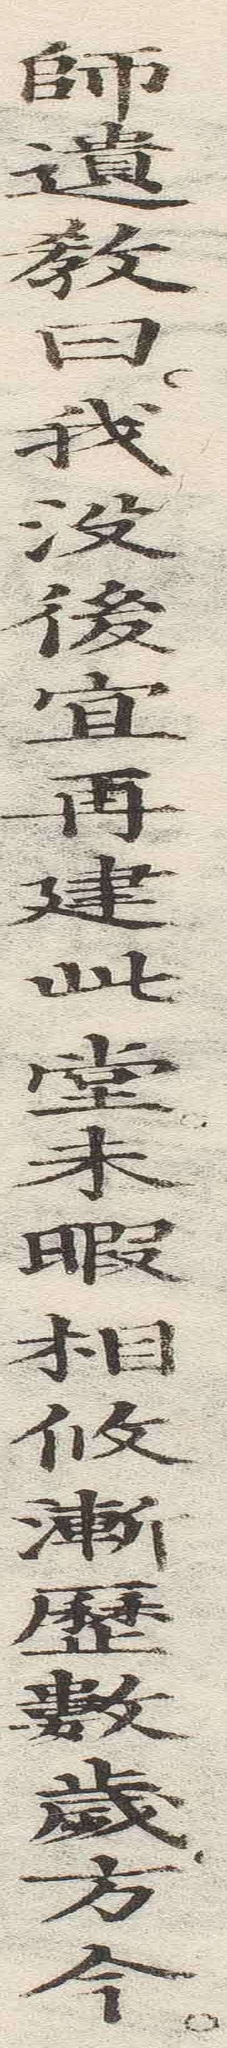師遺敎曰。我没後宜再建此堂。未暇相攸漸歷數歲。方今。
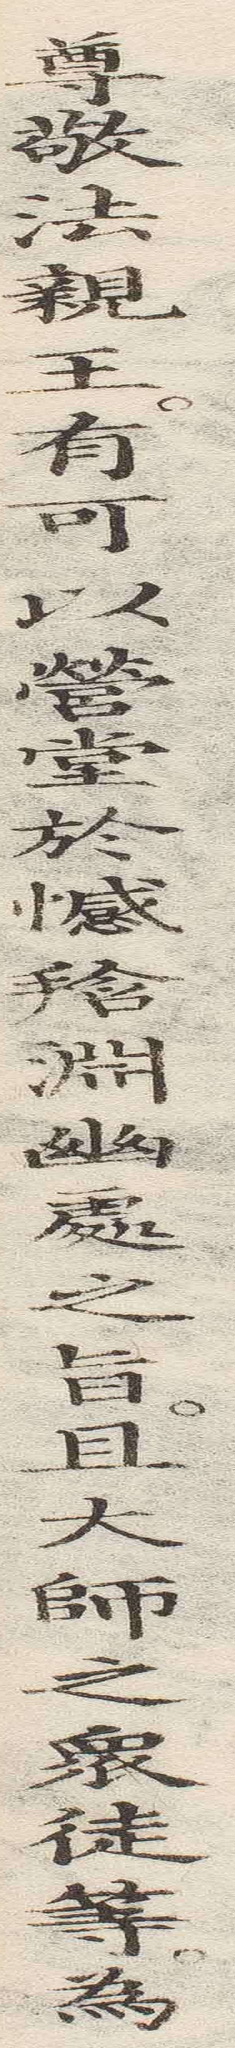尊敬法親王。有可以營堂於憾𤚥淵幽處之旨。且大師之衆徒等。為
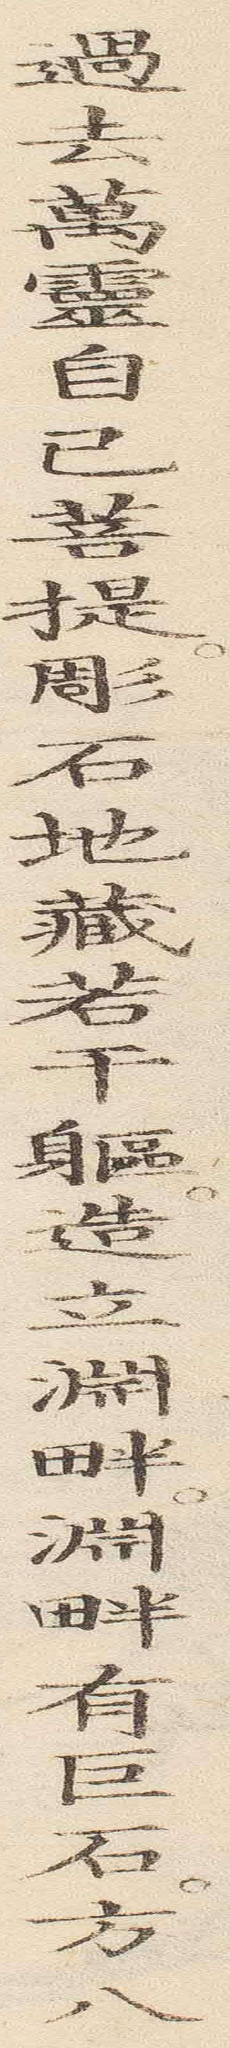過去萬靈自已菩提。彫石地藏若干軀。造立淵畔。淵畔有巨石。方八
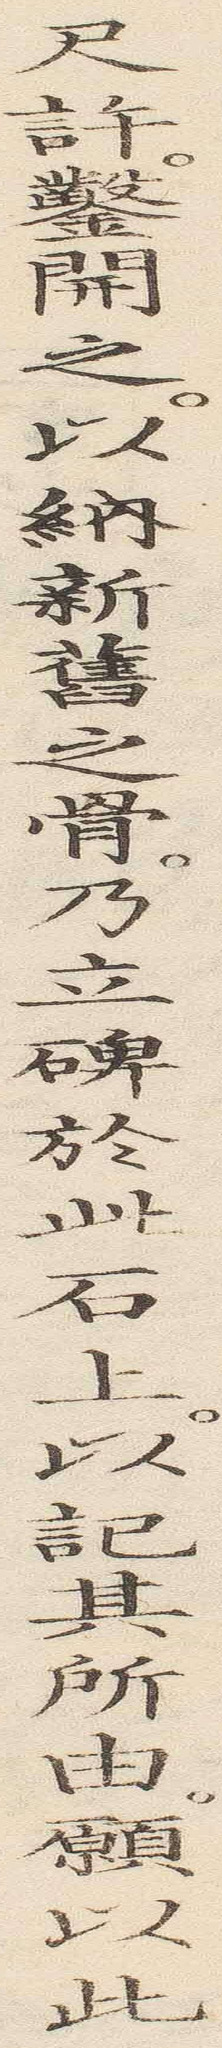尺許。鑿開之。以納新舊之骨。乃立碑於此石上。以記其所由。願以此
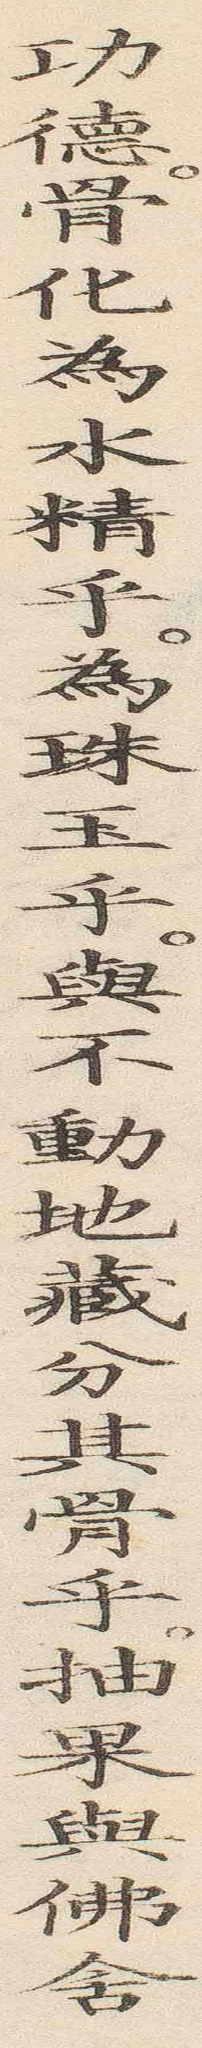功德。骨化為水精乎。為珠玉乎。與不動地藏分其骨乎。抽果與佛舍
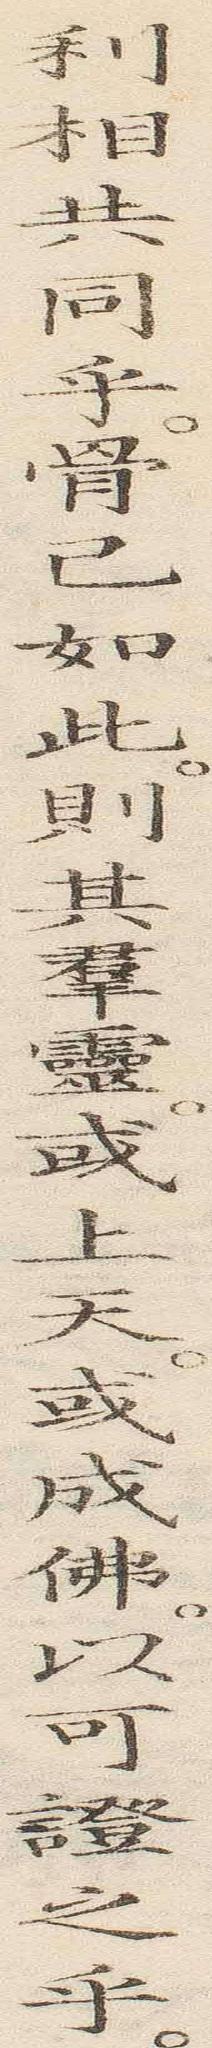利相共同乎。骨已如此。則其羣靈。或上天。或成佛。以可證之乎。
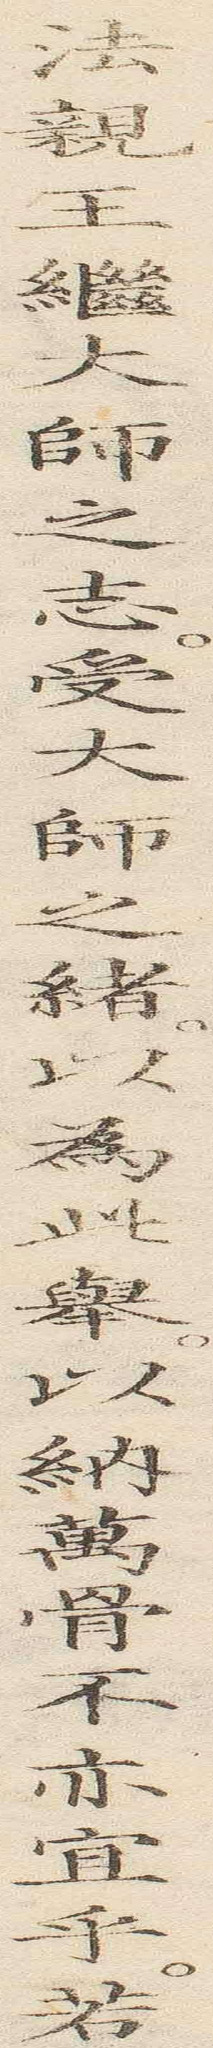法親王繼大師之志。受大師之緖。以為此舉。以納萬骨不亦宜乎。若
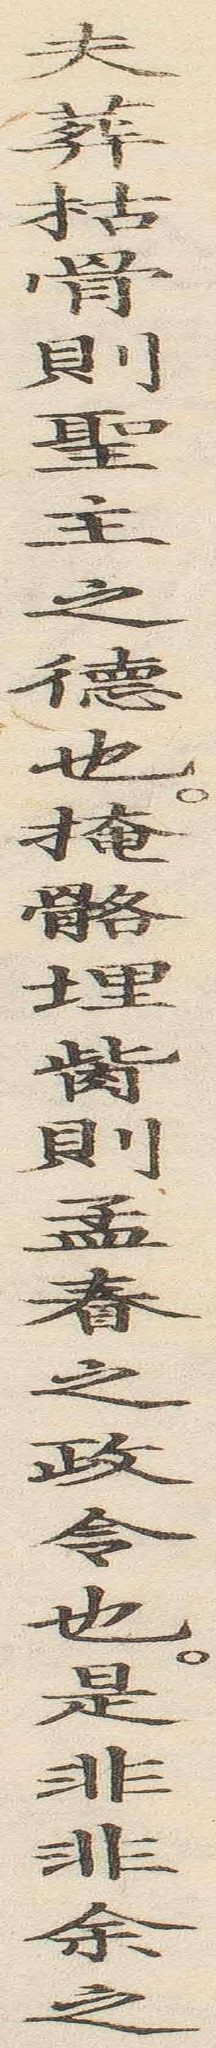夫葬枯骨則聖主之德也。掩骼埋胔則孟春之政令也。是非非余之
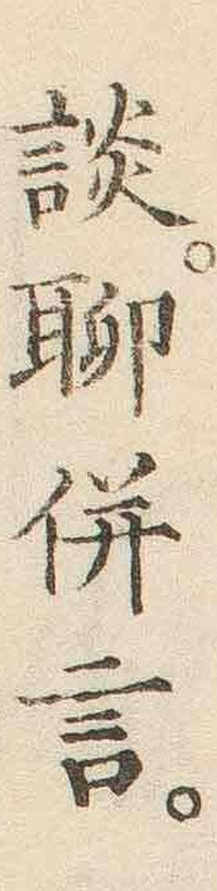談。聊併言。
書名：日光山志
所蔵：東京学芸大学附属図書館 国文学研究資料館
